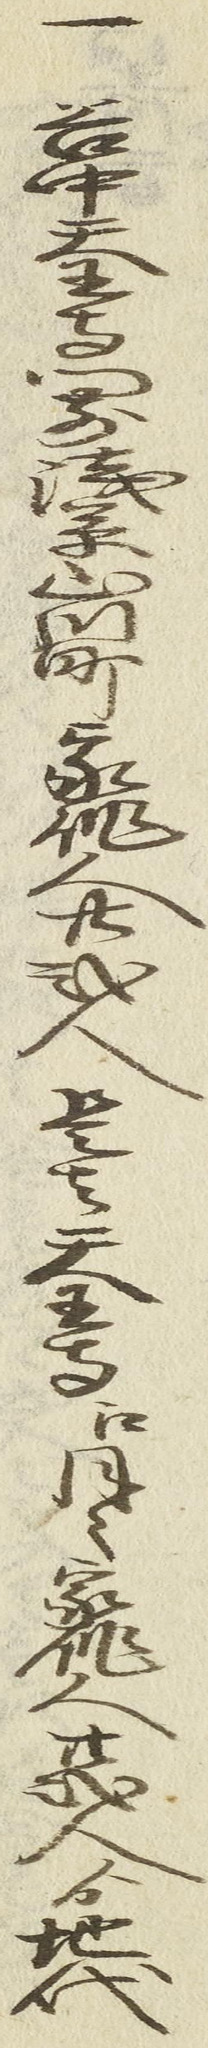一谷中天王寺門前浅草山川町家作人廿弐人是者天王寺江月々家作人廿弐人ゟ地代
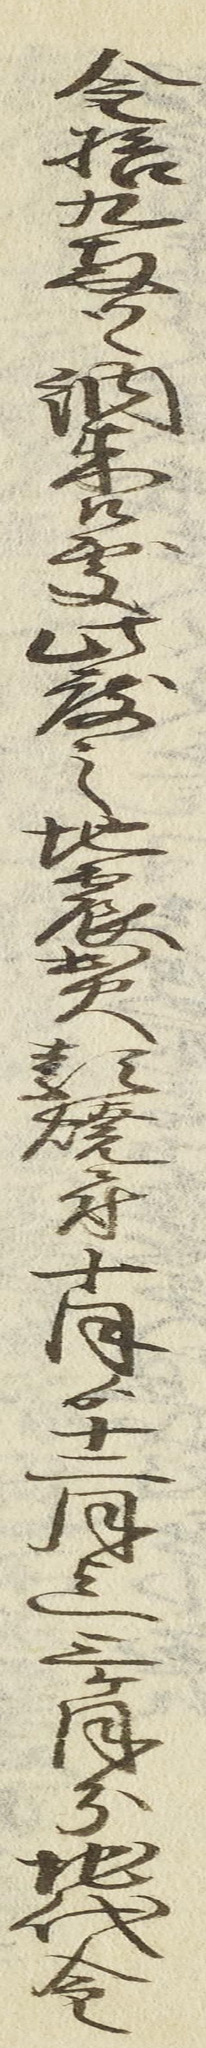金拾九両ツヽ納来候処此度之地震出火類焼ニ付十月ゟ十二月迄三ケ月分地代金
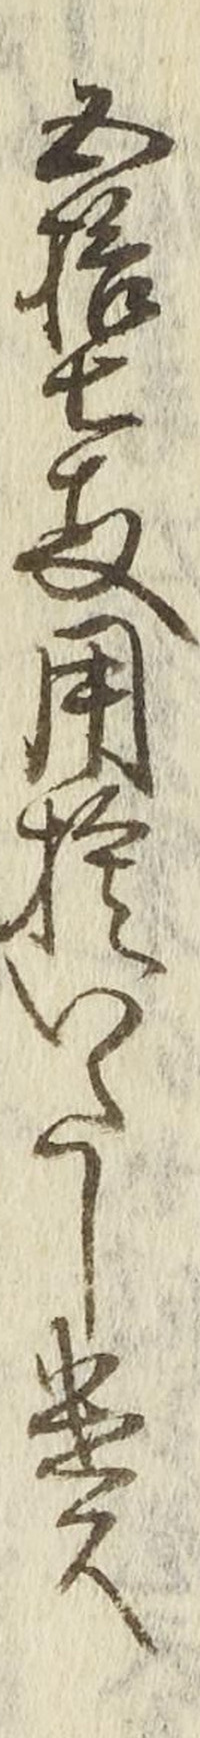五拾七両用捨いたし遣ス
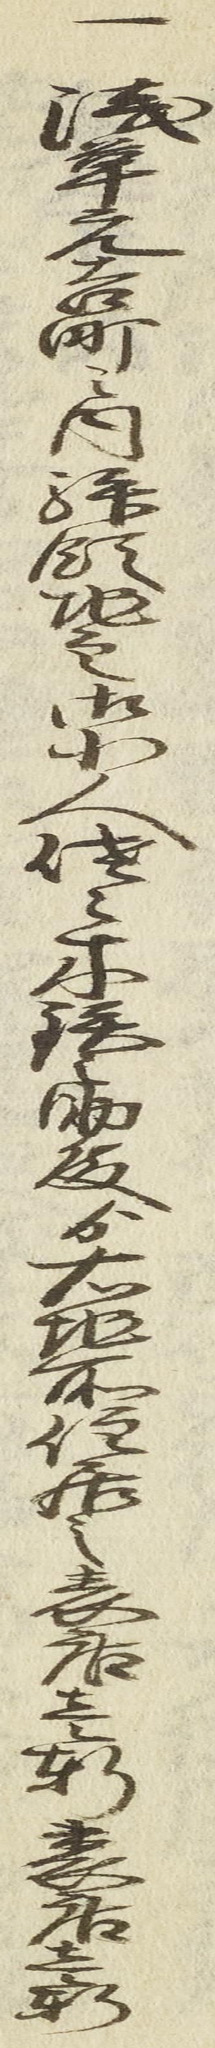一浅草元吉町之内拝領地主御小人佐々木鉄之助殿ゟ右地所住居之表店壱軒裏店壱軒
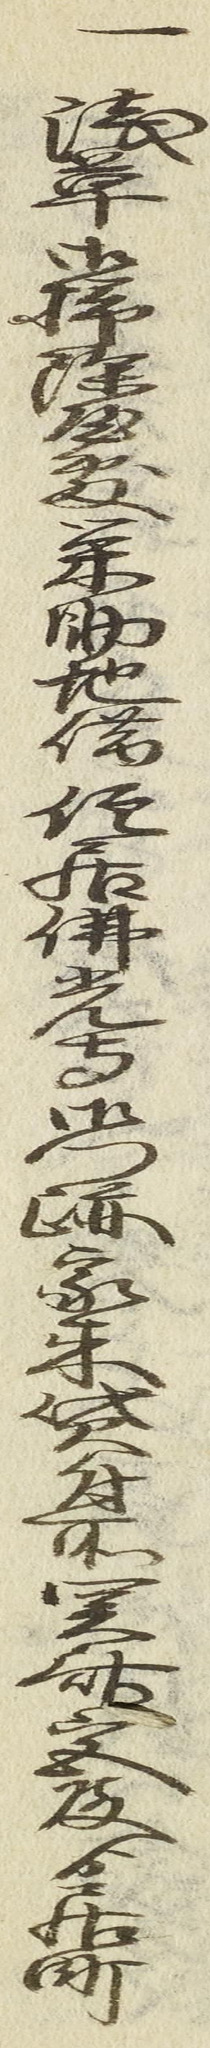一浅草御掃除屋敷栄助地借住居仏光寺御門跡家来貸付所関斎宮殿ゟ居町
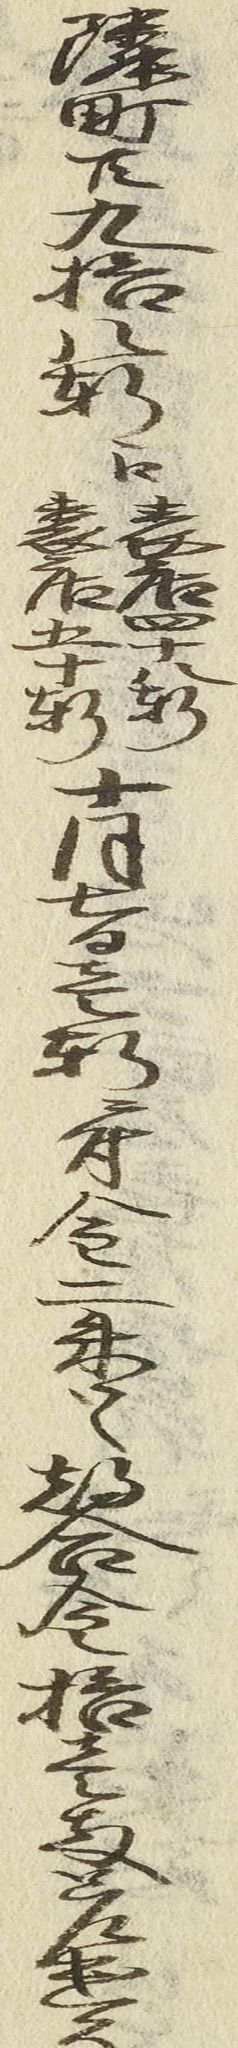隣町共九拾八軒江表店四十八軒裏店五十軒十月七日壱軒ニ付金二朱ツヽ都合金拾壱両差遣ス

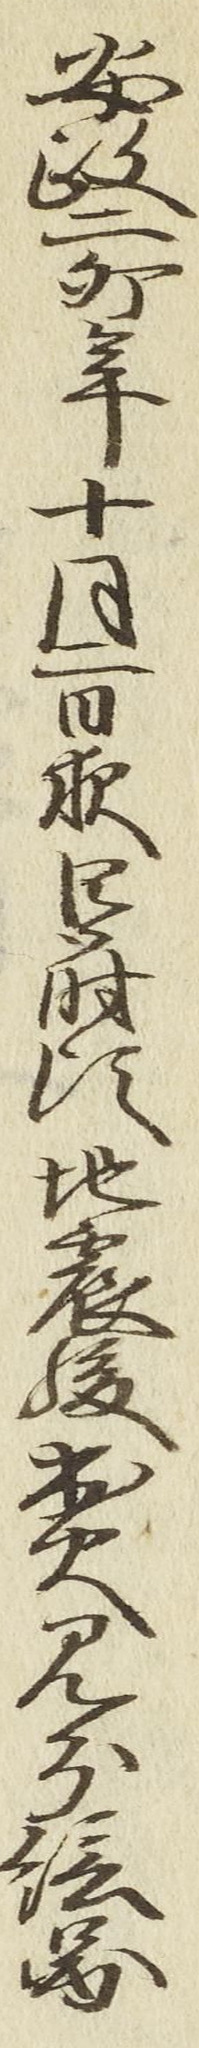安政二卯年十月二日夜四ツ時頃地震後出火見分絵図
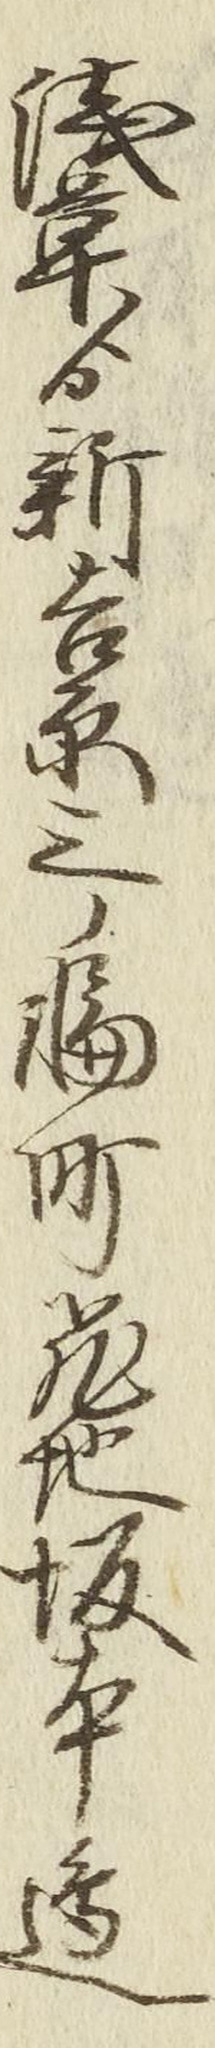浅草ゟ新吉原三ノ輪町飛地坂本辺
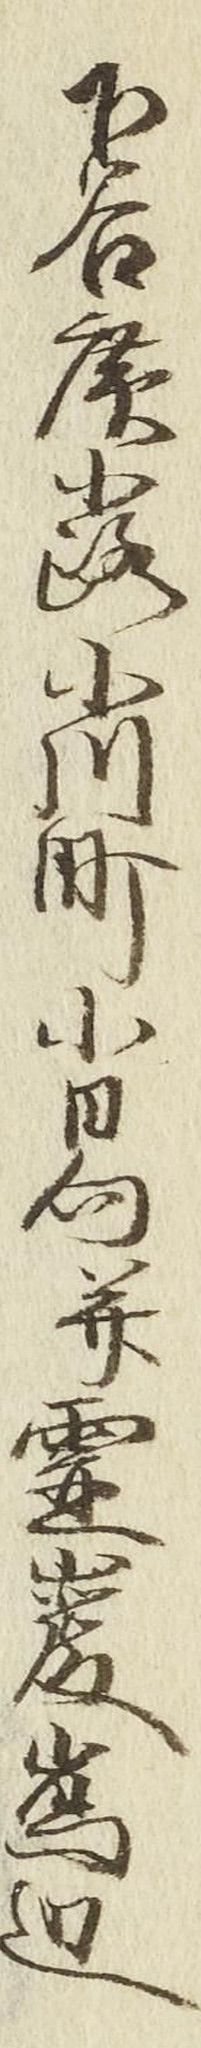下谷広小路小川町小日向幷霊巖嶋辺
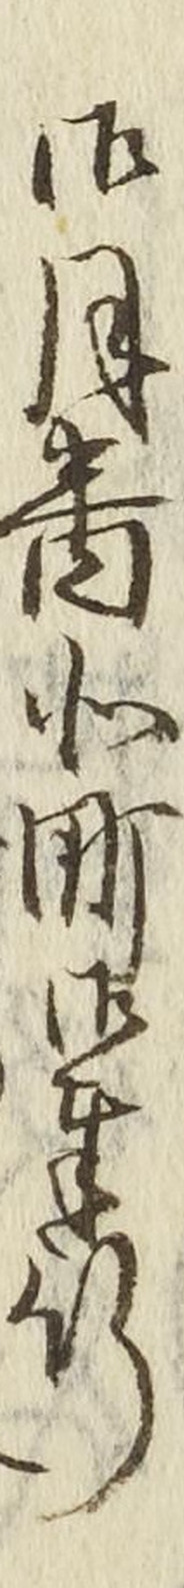御月番北町御奉行
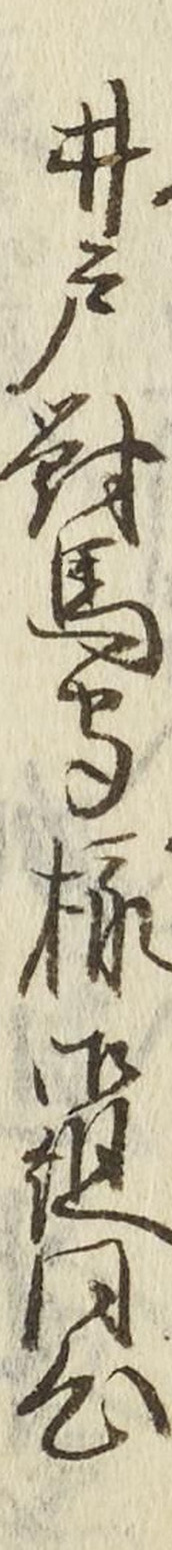井戸対馬守様御組同心
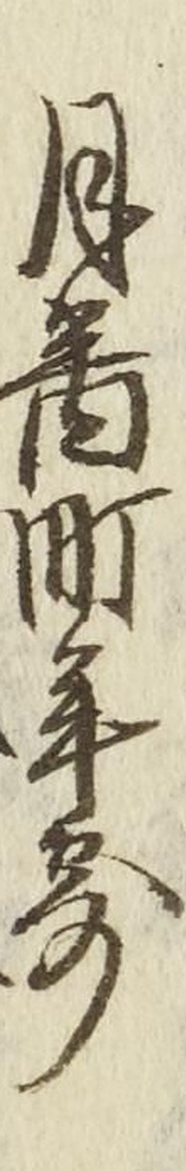月番町年寄
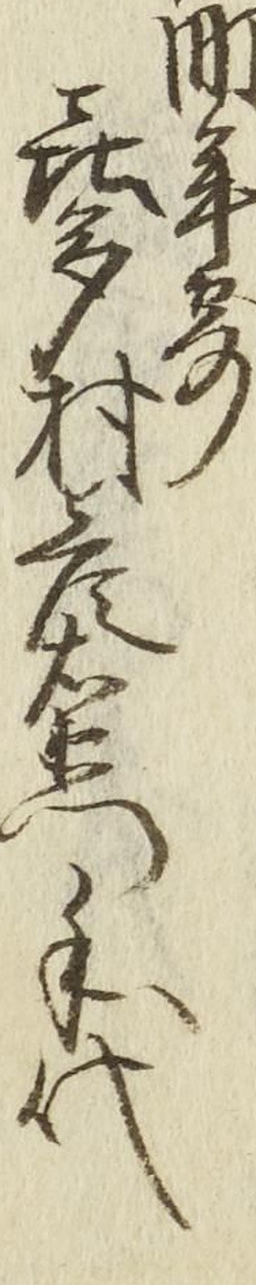喜多村彦右衛門手代
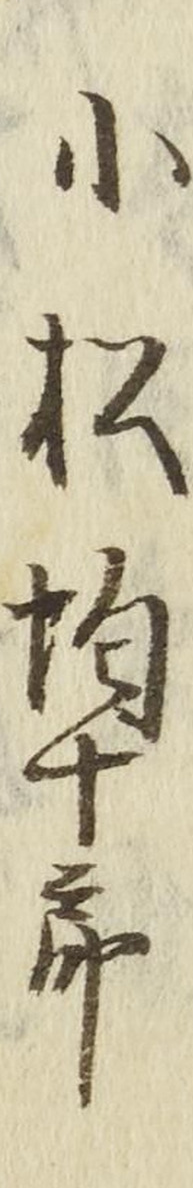小松均十郎
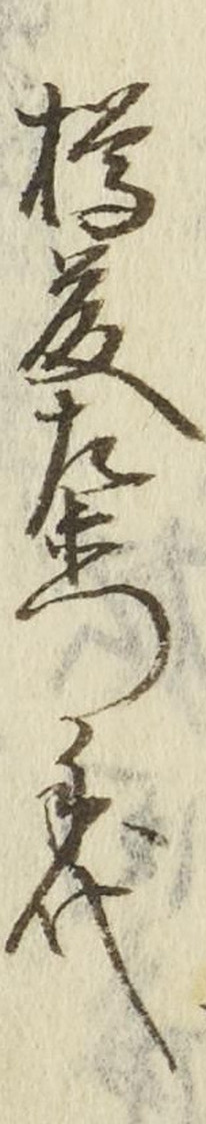樽藤左衛門手代
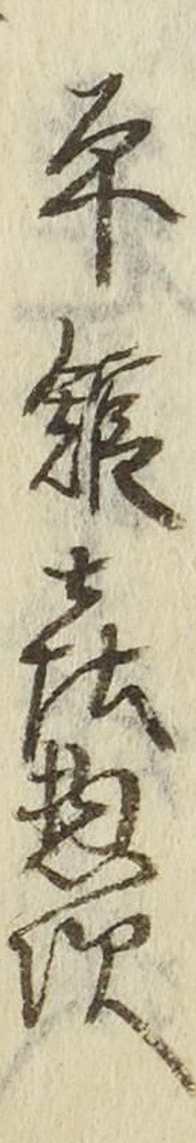平舘喜惣次
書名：安政二年震災記事　完
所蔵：東京大学地震研究所図書室 Earthquake Research Institute Library, The University of Tokyo, JAPAN
